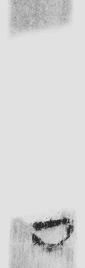{□四}
